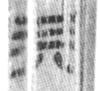而
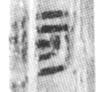可
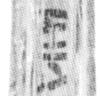胃（謂）
